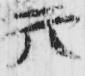亓
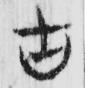古
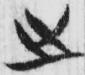之
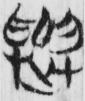○（舉）
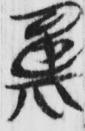禱
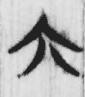大
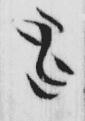水
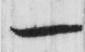一
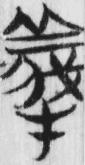犠
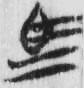馬
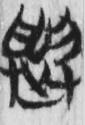○（舉）
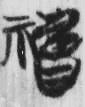禱
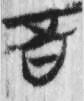吾（郚）
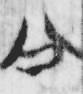公
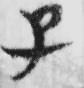子
